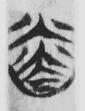{炎自}
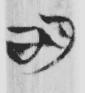明
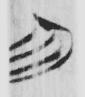勿
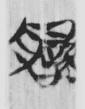䌛
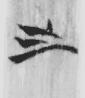之
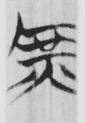庶
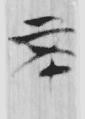不
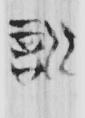訓
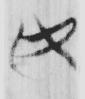女
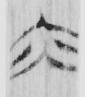亦
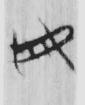母
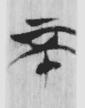不
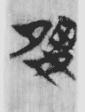{夕丮}
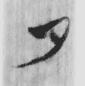夕
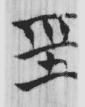巠
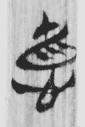惪
